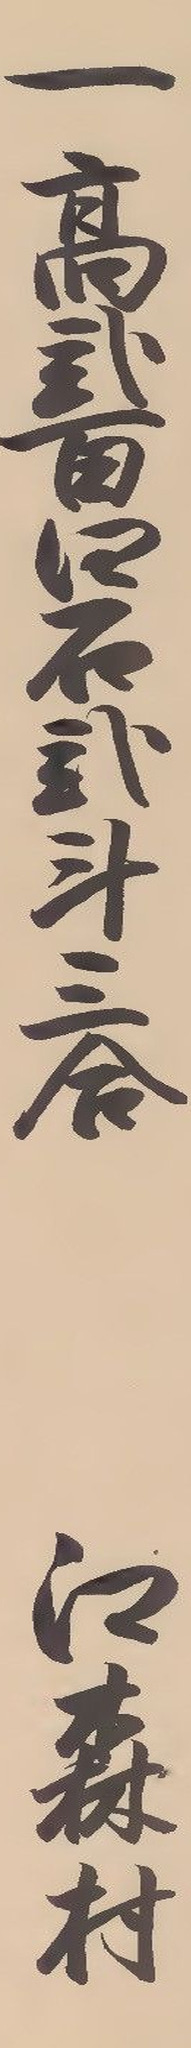一高弐百四石弐斗三合江森村
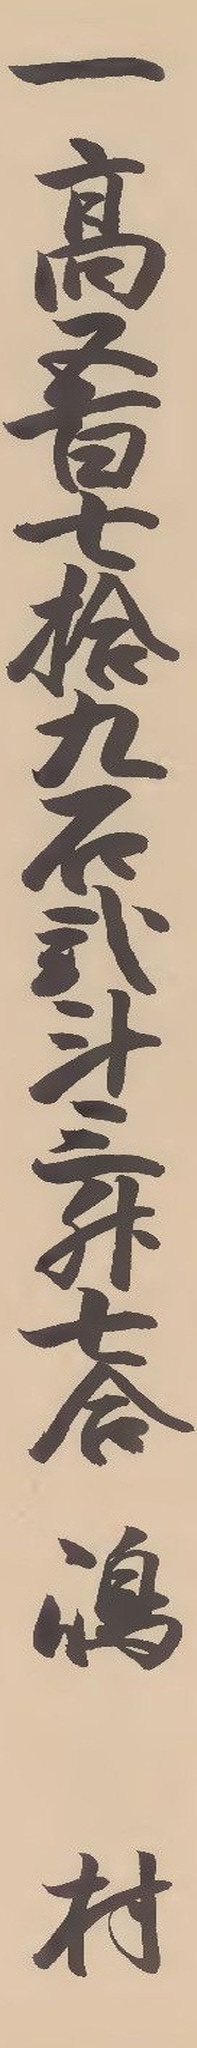一高五百七拾九石弐斗三升七合島村
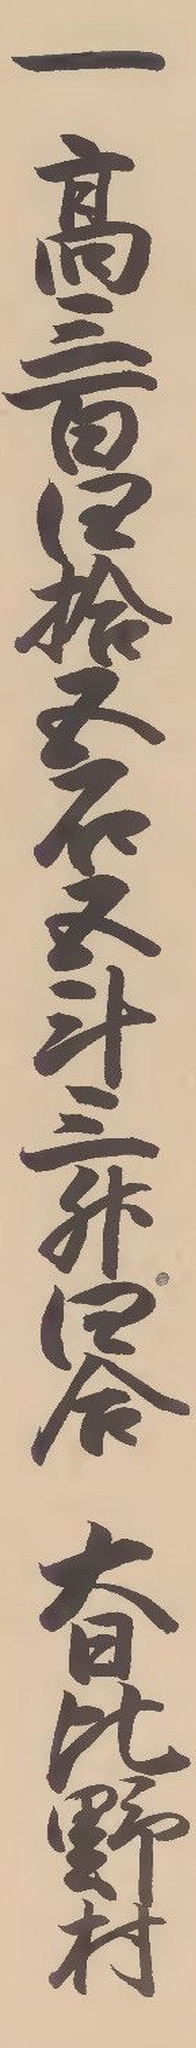一高三百四拾五石五斗三升四合大日比野村

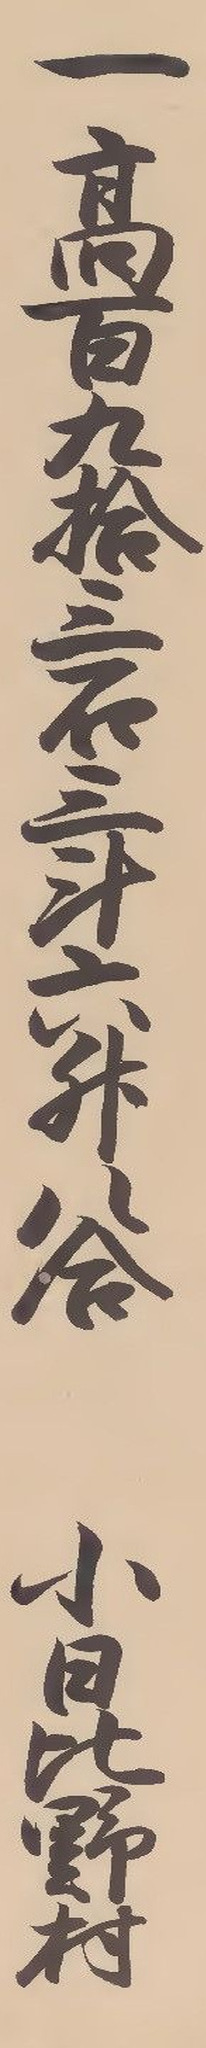一高百九拾三石三斗六升八合小日比野村
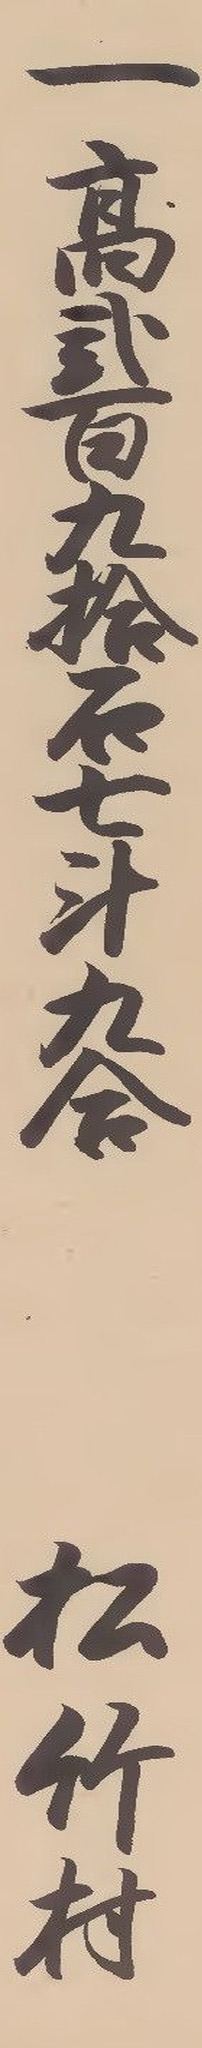一高弐百九拾石七斗九合松竹村
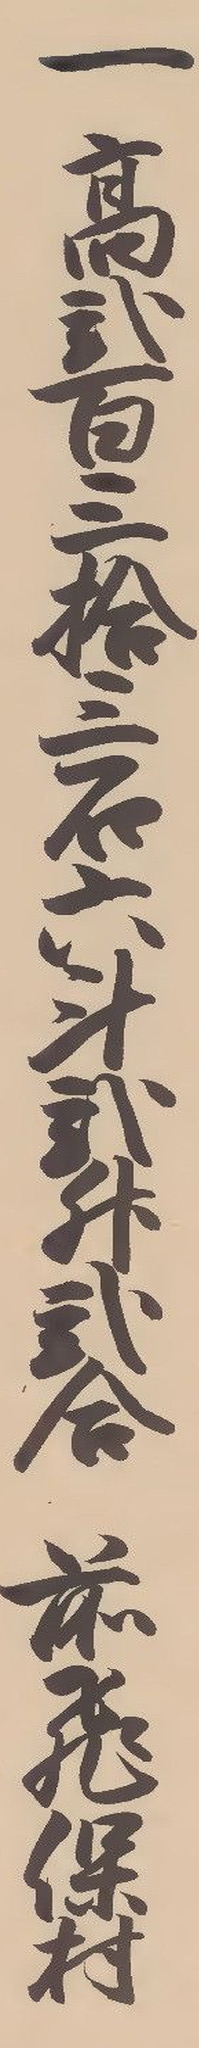一高弐百三拾三石六斗弐升弐合前飛保村
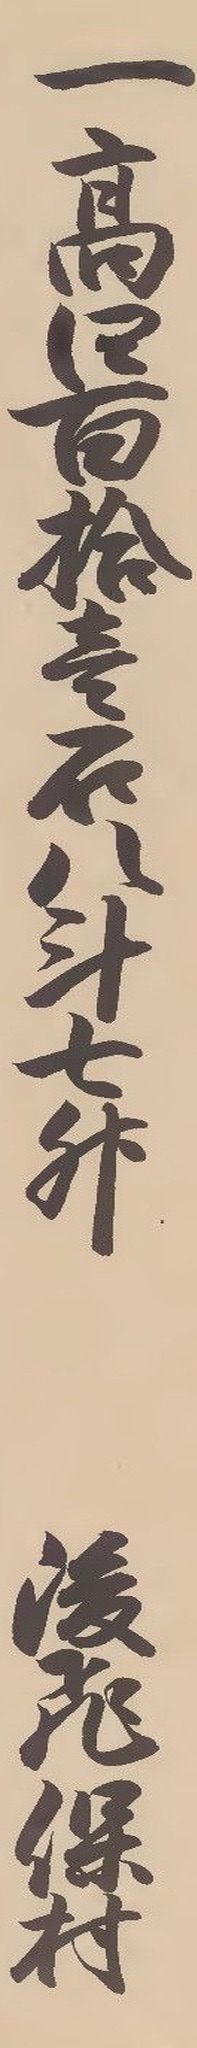一高四百拾壱石八斗七升後飛保村
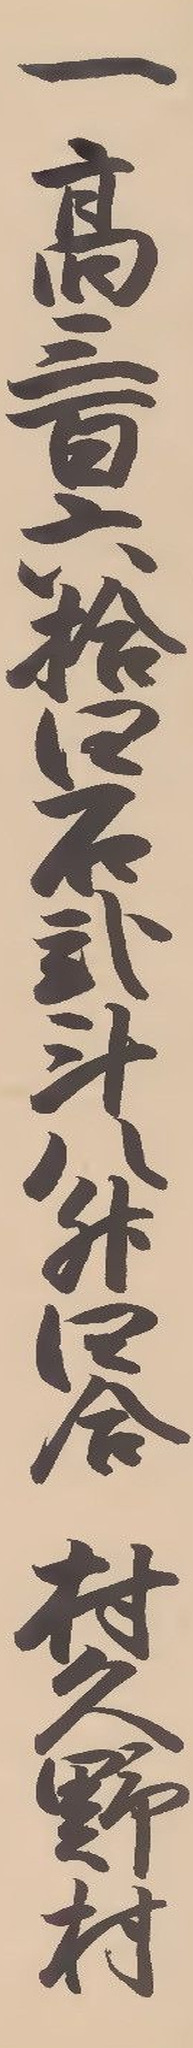一高三百六拾四石弐斗八升四合村久野村
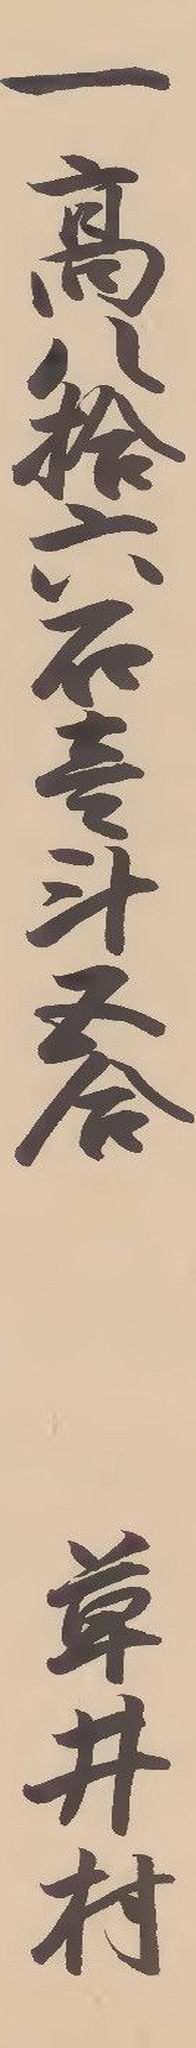一高八拾六石壱斗五合草井村
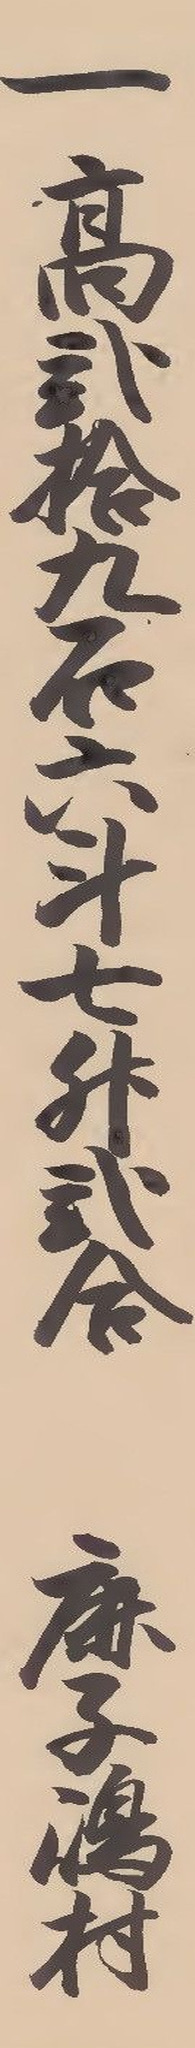一高弐拾九石六斗七升弐合鹿子島村
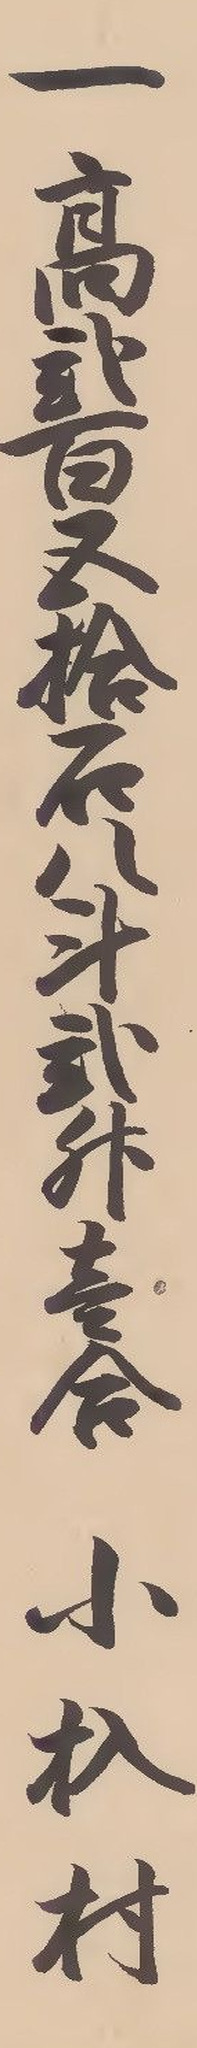一高弐百五拾石八斗弐升壱合小杁村

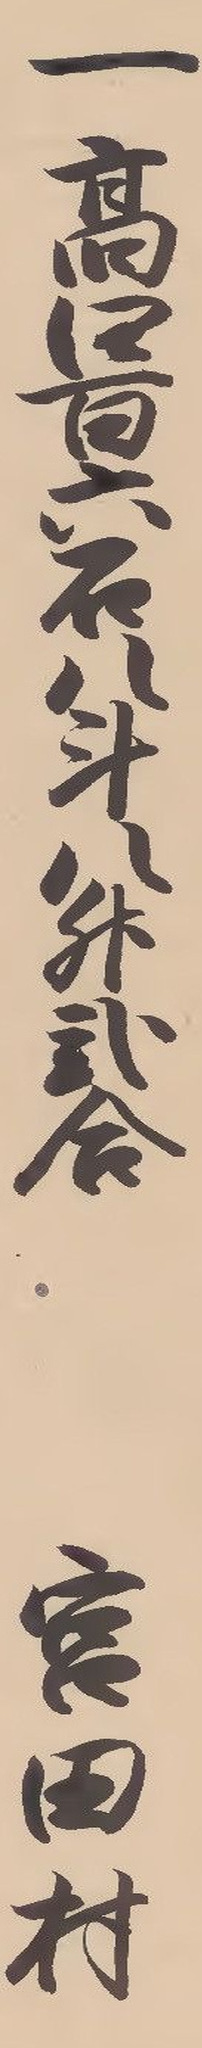一高四百六石八斗八升弐合宮田村
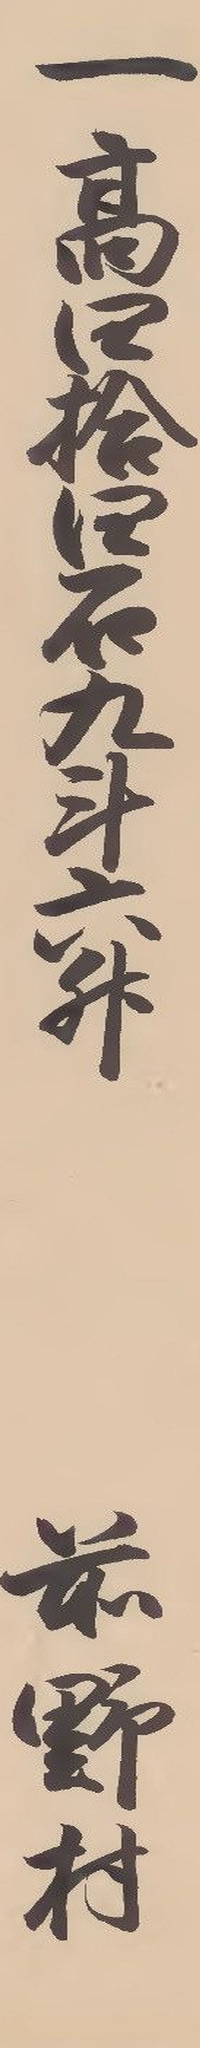一高四拾四石九斗六升前野村
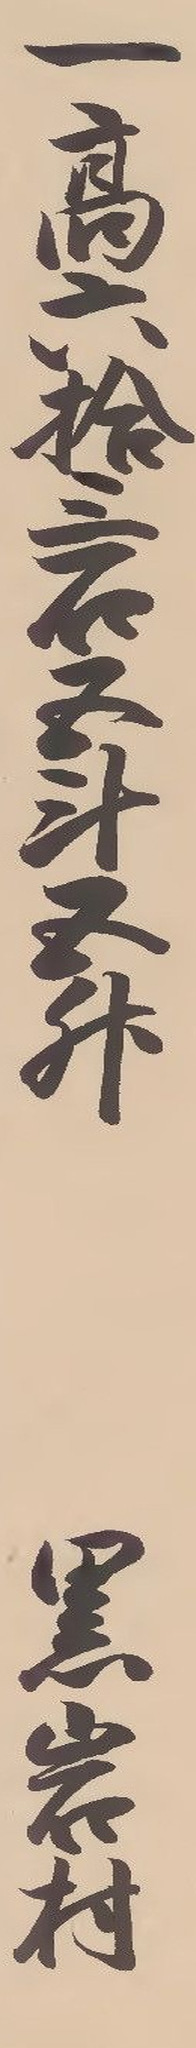一高六拾三石五斗五升黒岩村
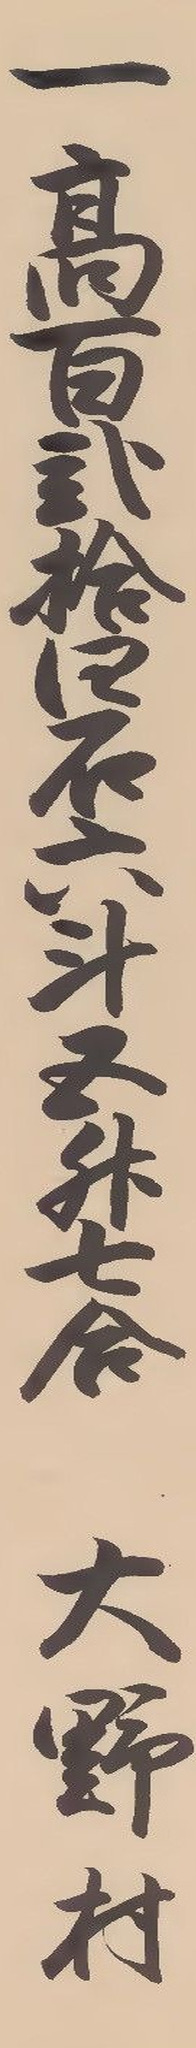一高百弐拾四石六斗五升七合大野村
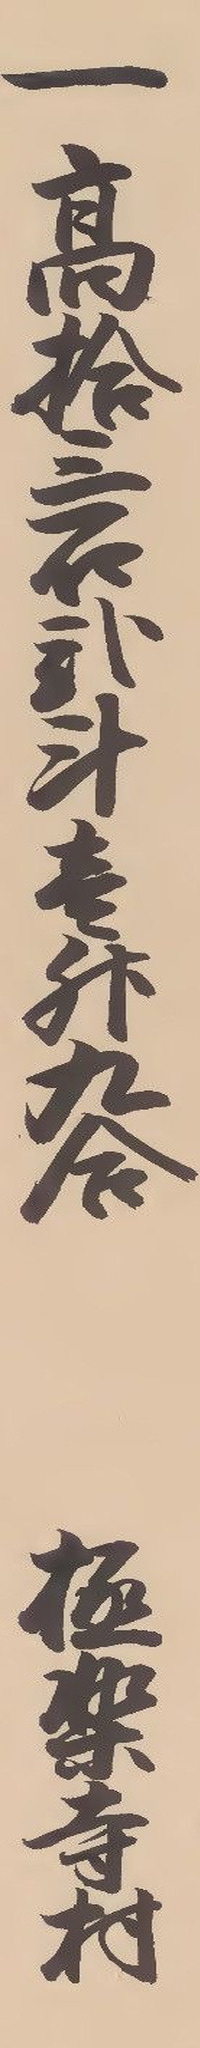一高拾三石弐斗壱升九合極楽寺村
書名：尾張国郷帳
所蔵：国立公文書館 National Archives of Japan
